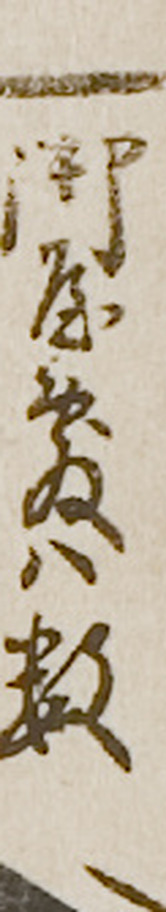御屋敷は数
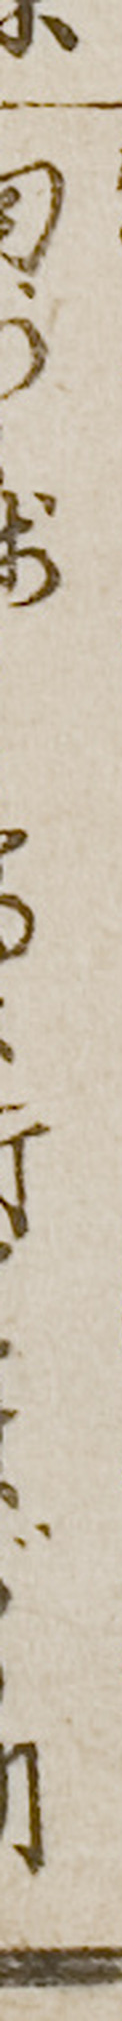向少々残し富よし町はまぐり町
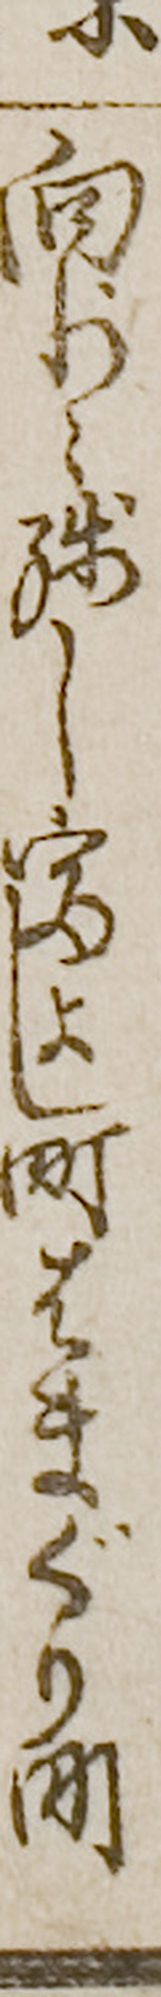向少々残し富よし町はまぐり町
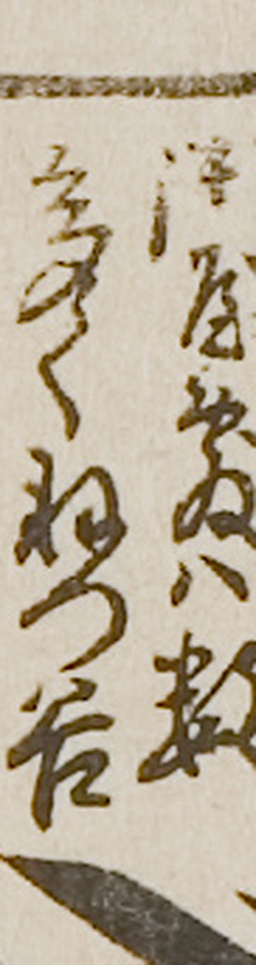多くねつ谷
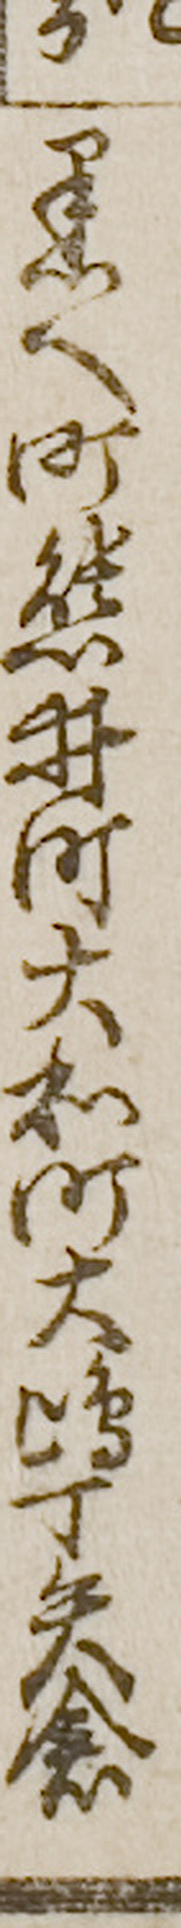黒へ町熊井町大和町大嶋丁矢倉
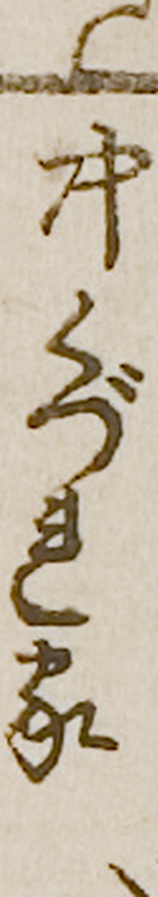中くづれ家
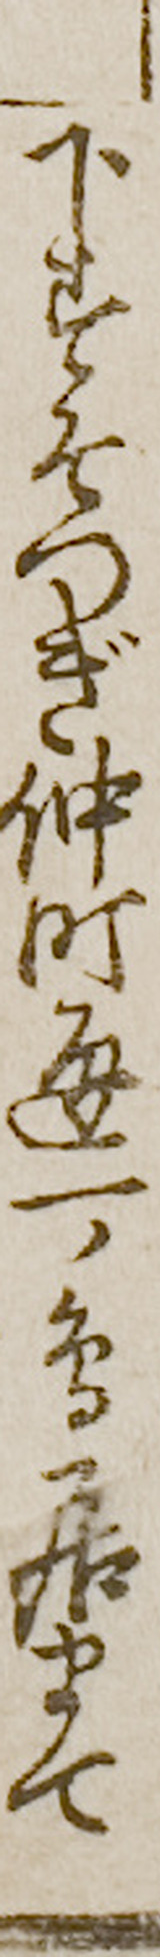下すそつぎ仲町通一ノ鳥居まて
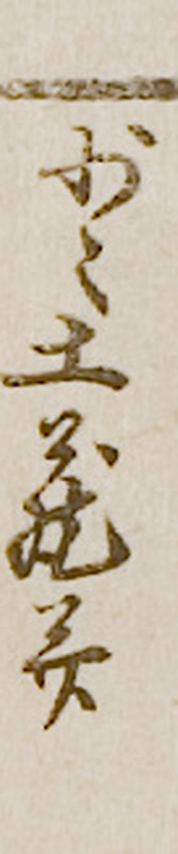少々土蔵并
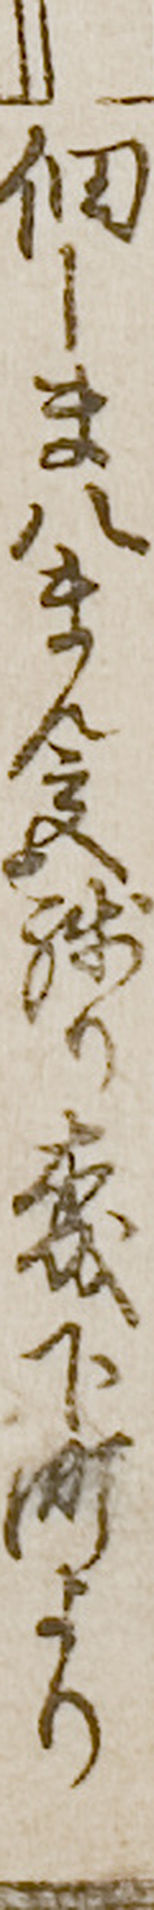佃しま八まん宮残り森下町より
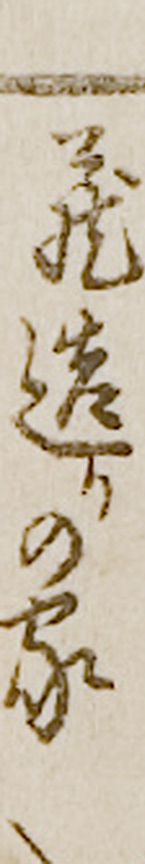蔵造りの家
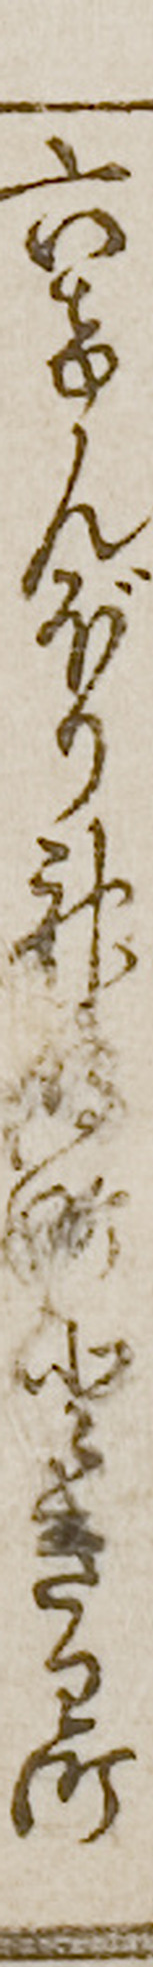六けんぼり神明町ときわ町
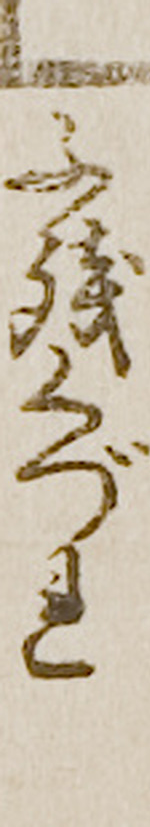不残くづれ
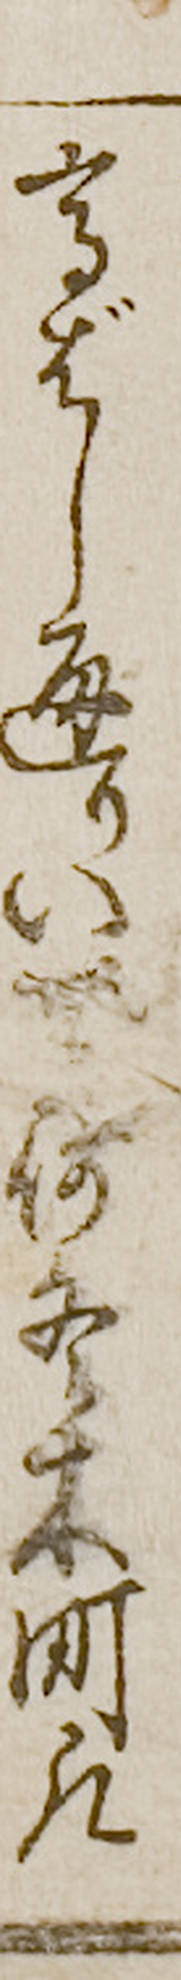高ばし通りいせ崎冬木町凡
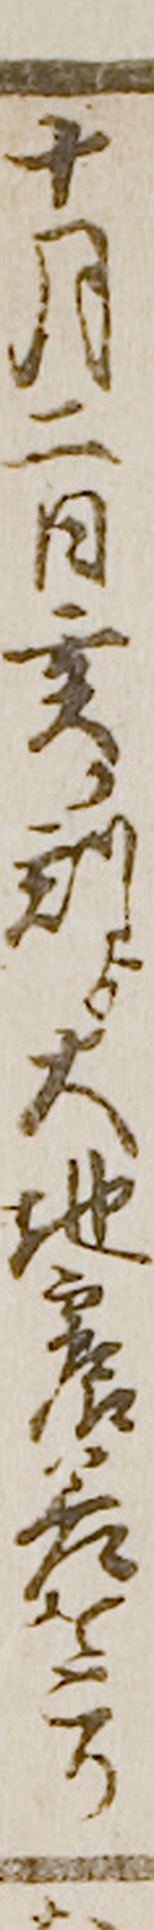十月二日亥の刻ゟ大地震差をこり
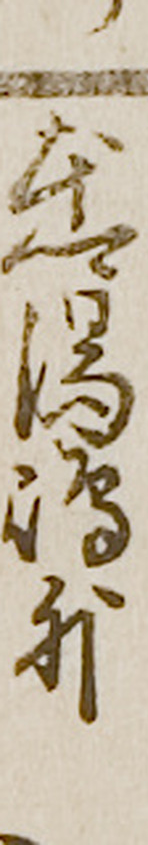本郷湯嶋外
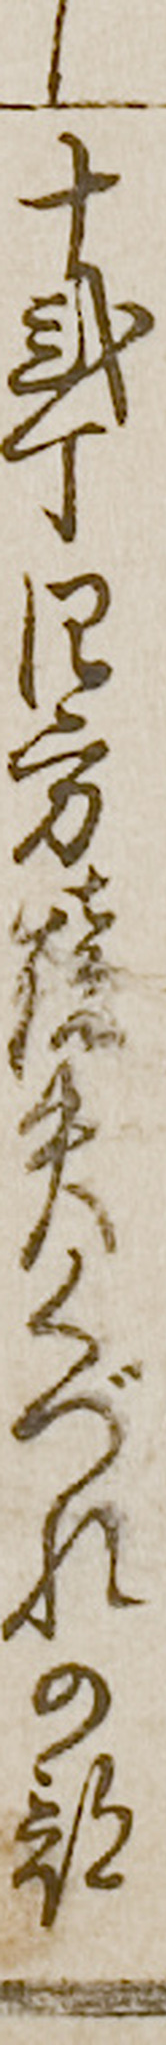十弐丁四方焼失くづれの部
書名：東都珍事実録咄
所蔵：東京大学総合図書館 General Library in the University of Tokyo, JAPAN
